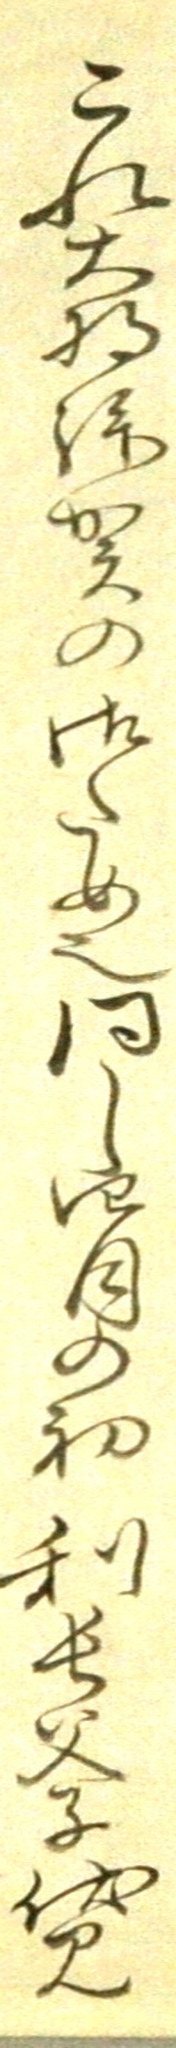これ大将拝賀の御ため也同し四月の初利長父子伏見
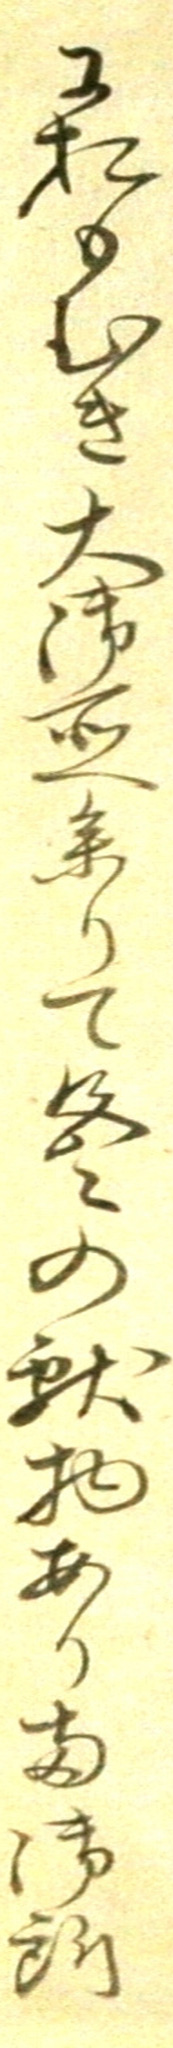におもむき大御所へ参りて色々の献物あり両御所
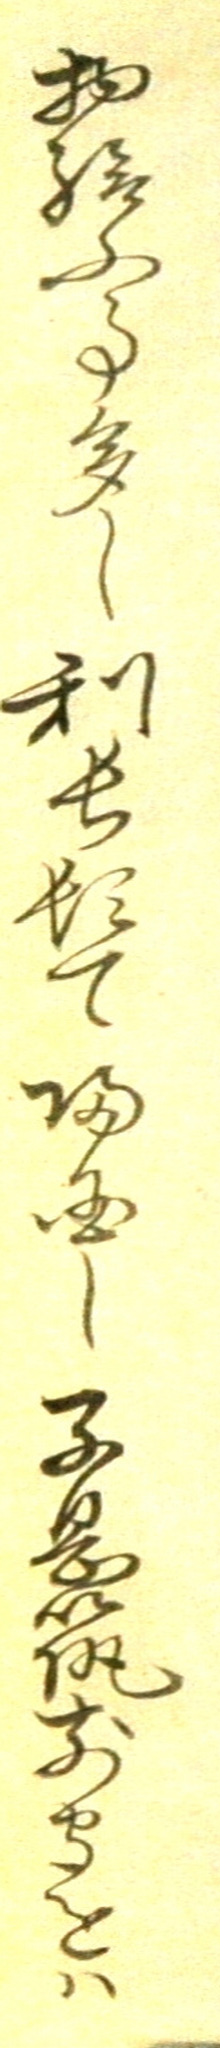物給ふ事多し利長頓て帰国し子息筑前守をは

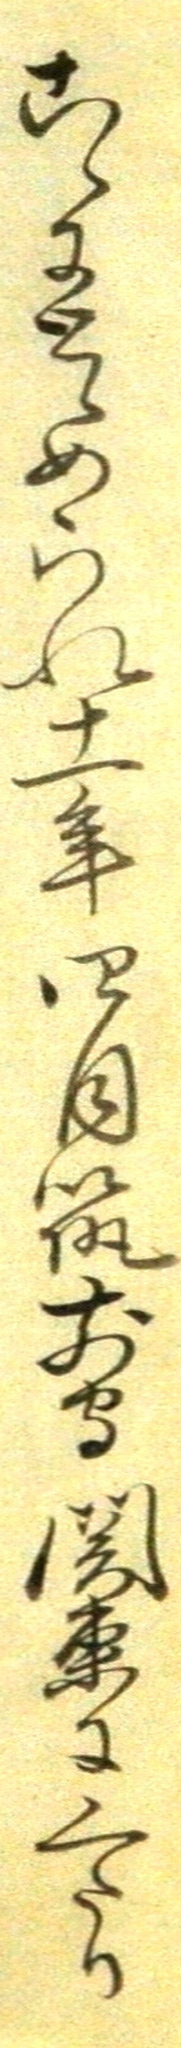こゝにとゝめられ十一年四月筑前守関東にくたり
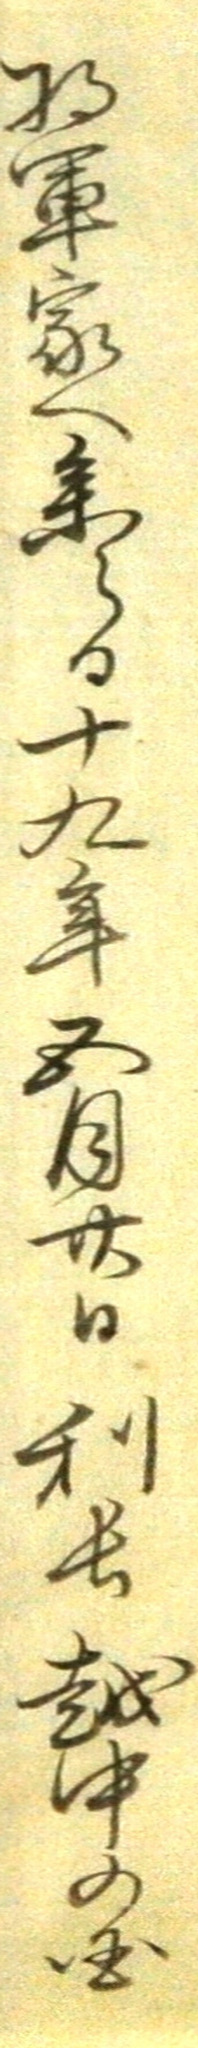将軍家へ参らる十九年五月廿日利長越中の国
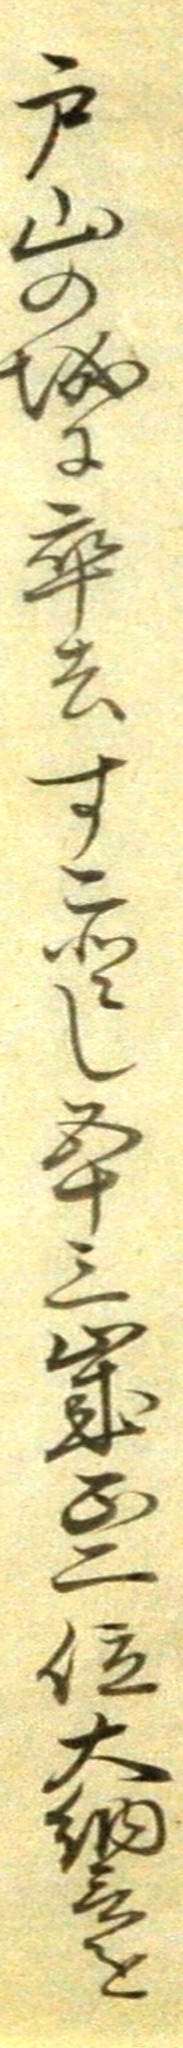戸山の城に卒去すことし五十三歳正二位大納言を
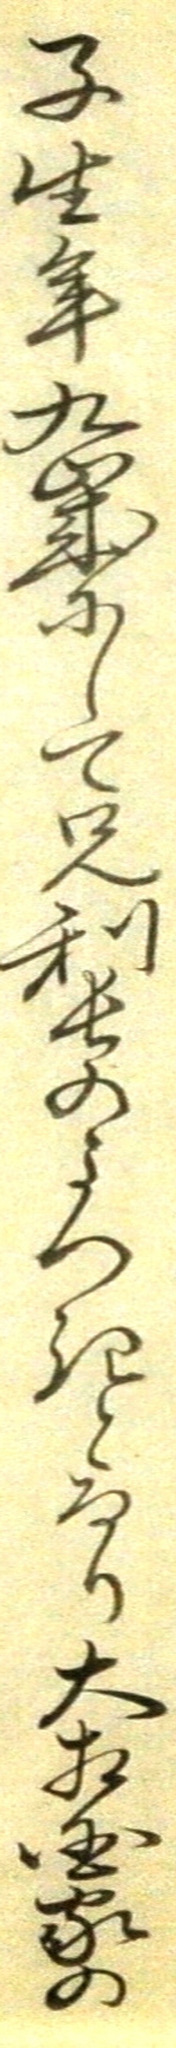子生年九歳にして兄利長のよつきとなり大相国家の
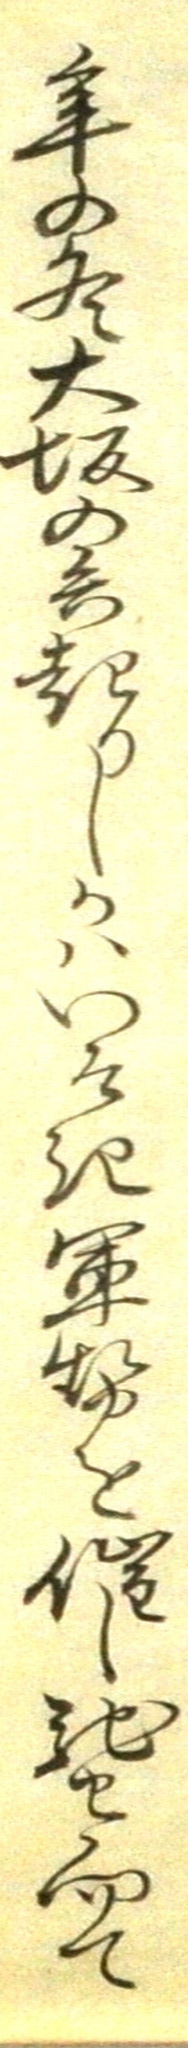年の冬大坂の兵起りしかはいそき軍勢を催し馳せ向て
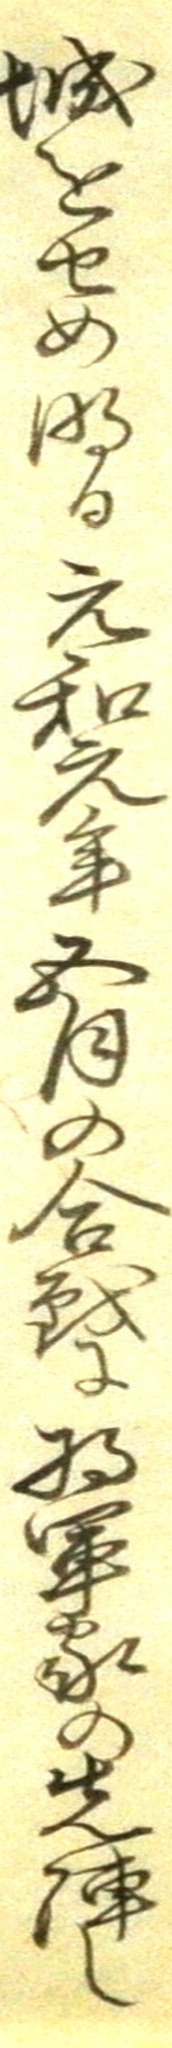城をせめ明る元和元年五月の合戦に将軍家の先陣し
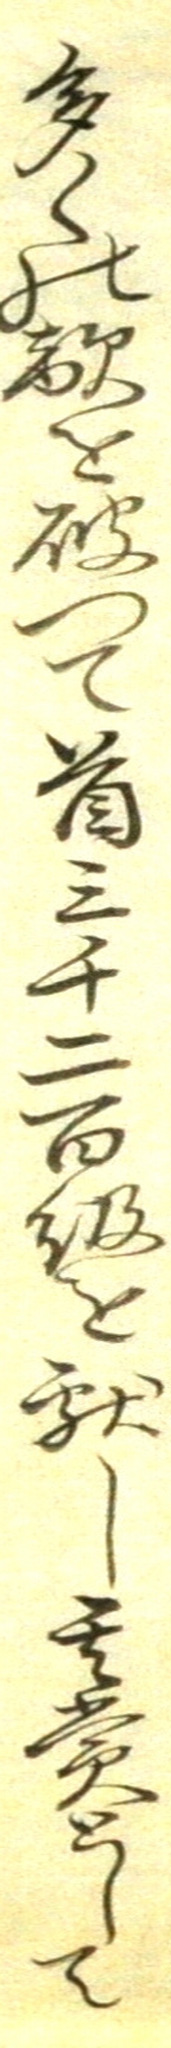多くの敵を破つて首三千二百級を献し其賞として
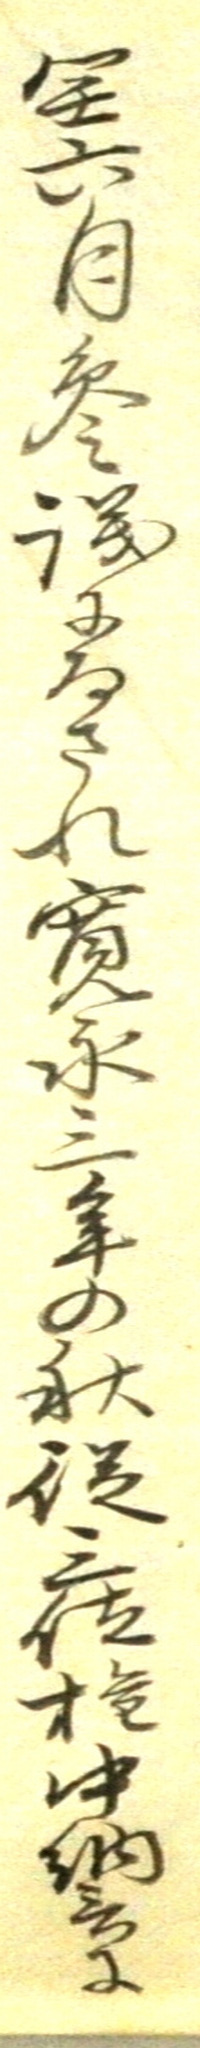閏六月参議になされみ年寄寛永三年の秋従三位権中納言に
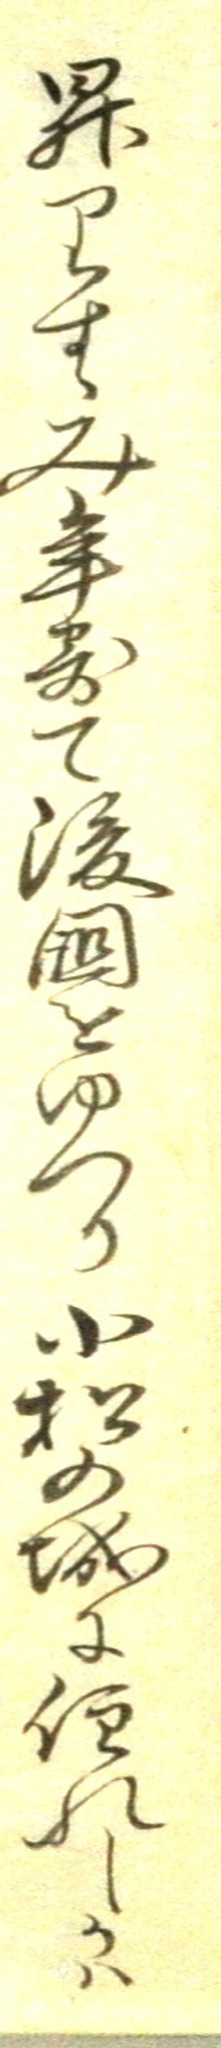昇りすゝみ年寄て後国をゆつり小松の城に住れしかは
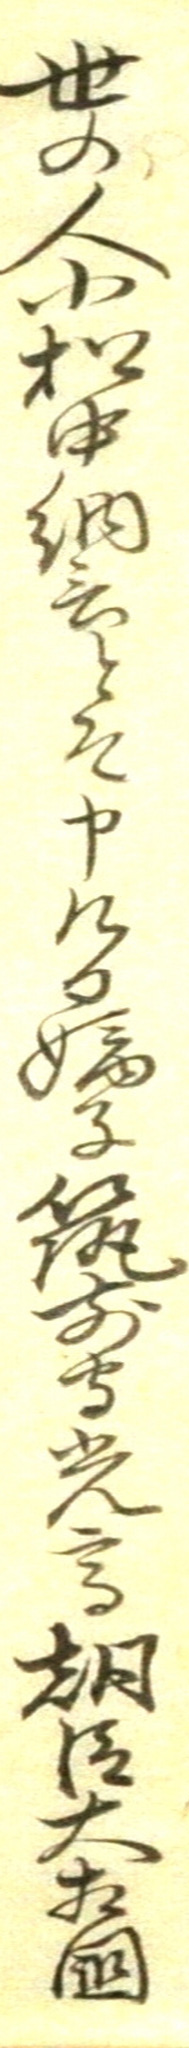世の人小松中納言とそ申ける嫡子筑前守光高朝臣大相国
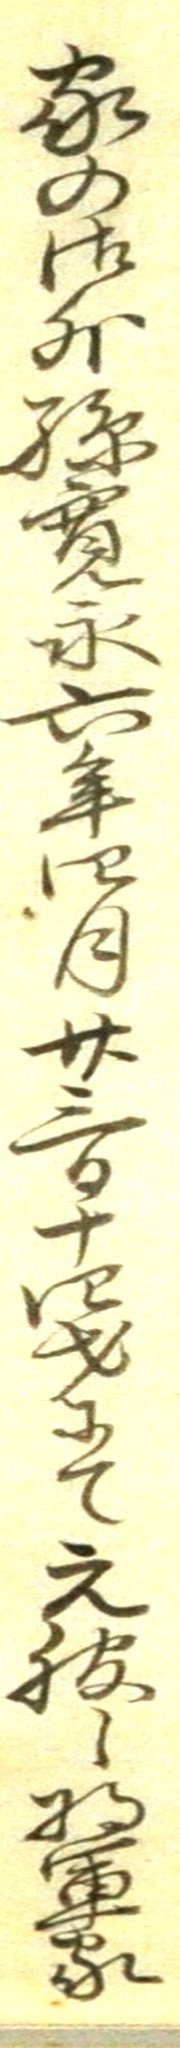家の御外孫寛永六年四月廿三日十四歳にて元服し将軍家
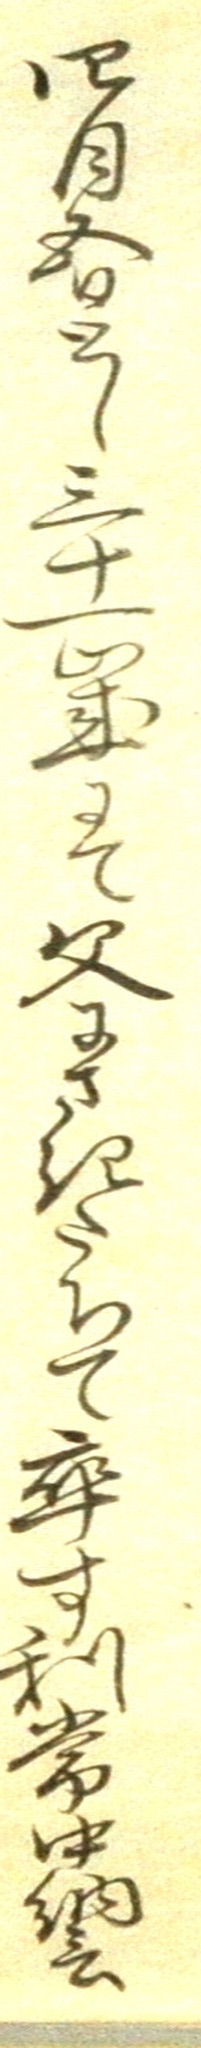四月五日とし三十一歳にて父にさきたちて卒す利常中納言
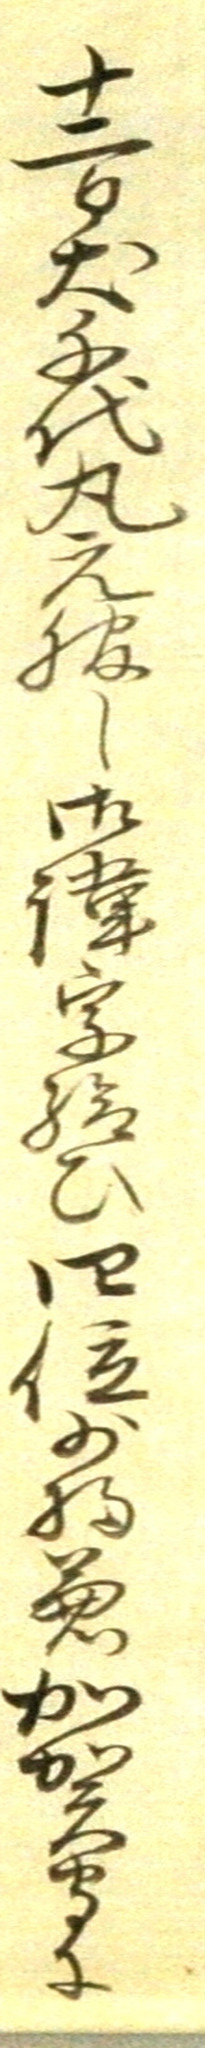十二日犬千代丸元服し御諱字給ひ四位少将兼加賀守に
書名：藩翰譜（七・上）
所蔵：伊那市立高遠町図書館・合同会社AMANE
